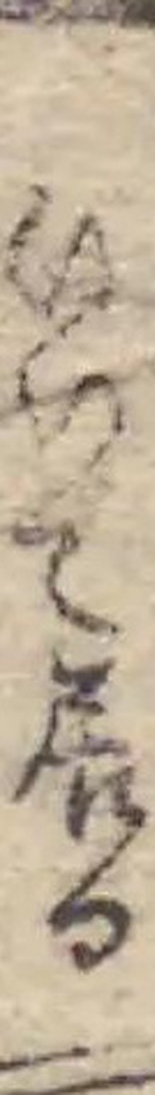ひいて居る
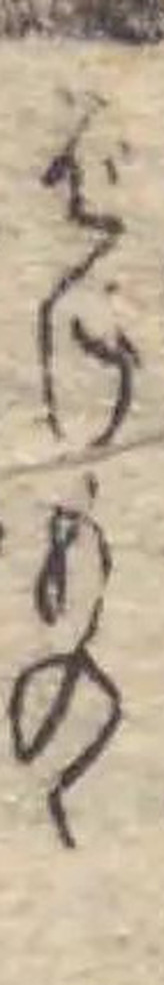ばけものゝ
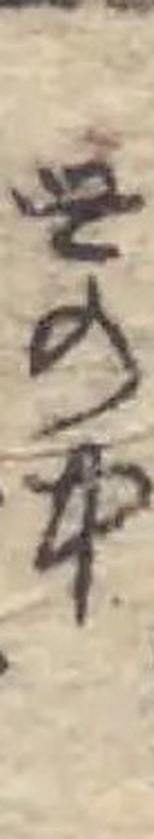世の中
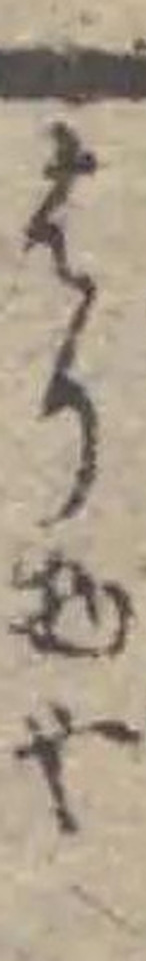はり物や
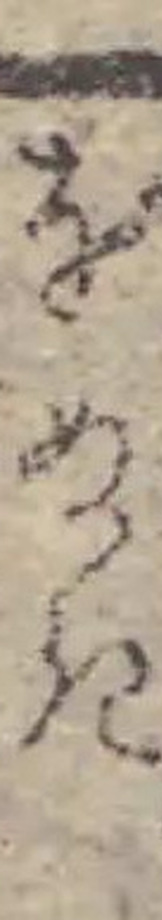をぬき
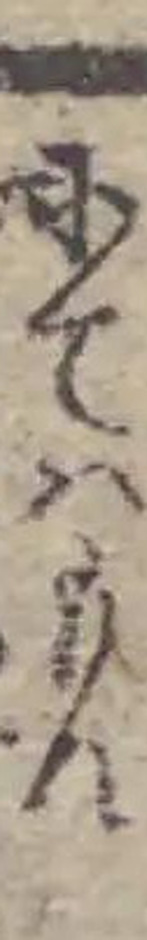にてはもん
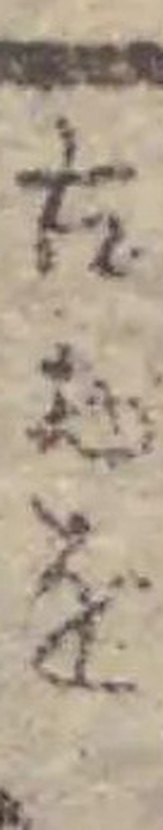古物を
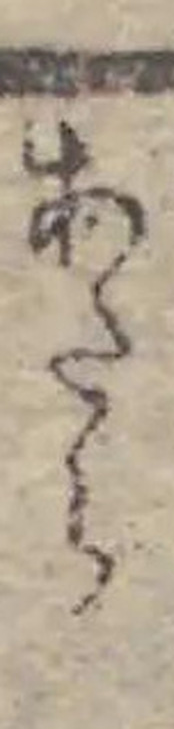あたら
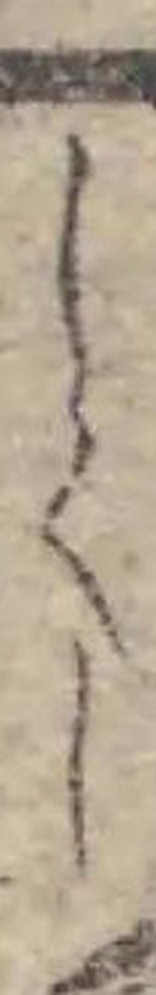しくし
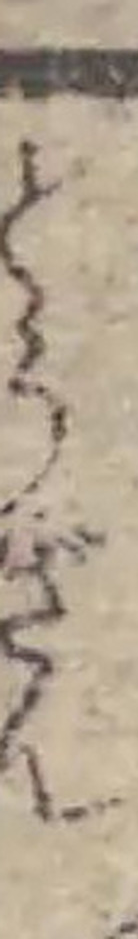とうざん
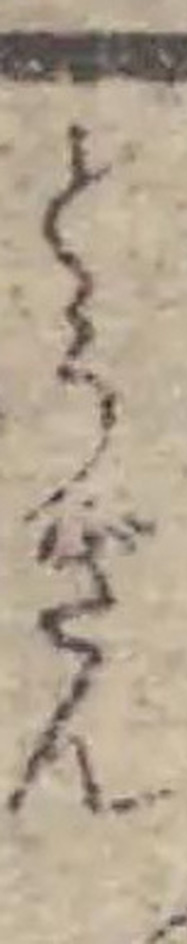とうざん
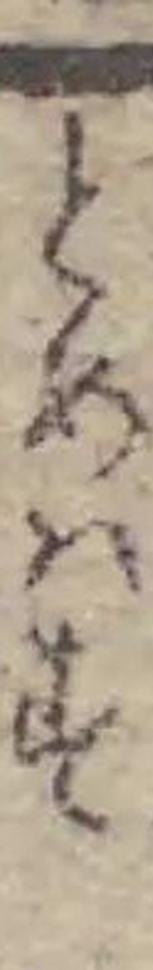とめはす
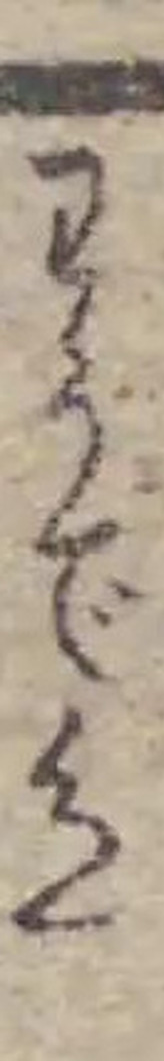わうで色
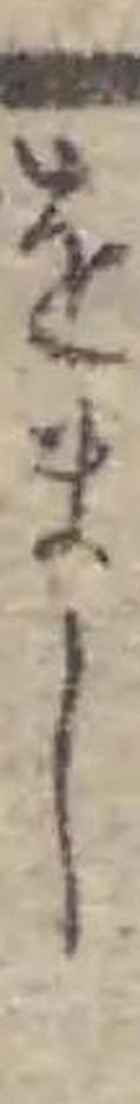をまし
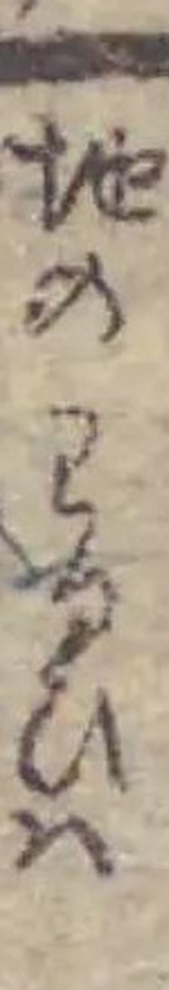地のわるひは
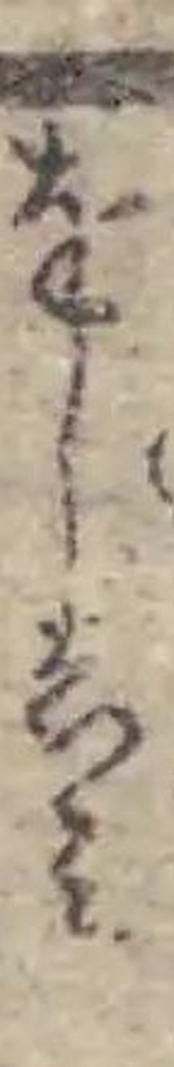をししみ
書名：作意妖恐懼感心 2巻
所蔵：国立国会図書館 National Diet Library, JAPAN
